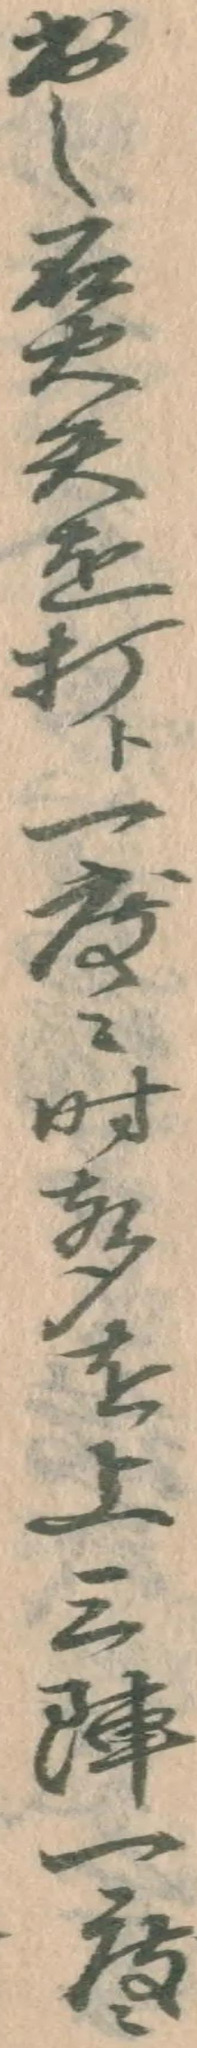出し石火矢を打と一度に時声を上三陣一度に
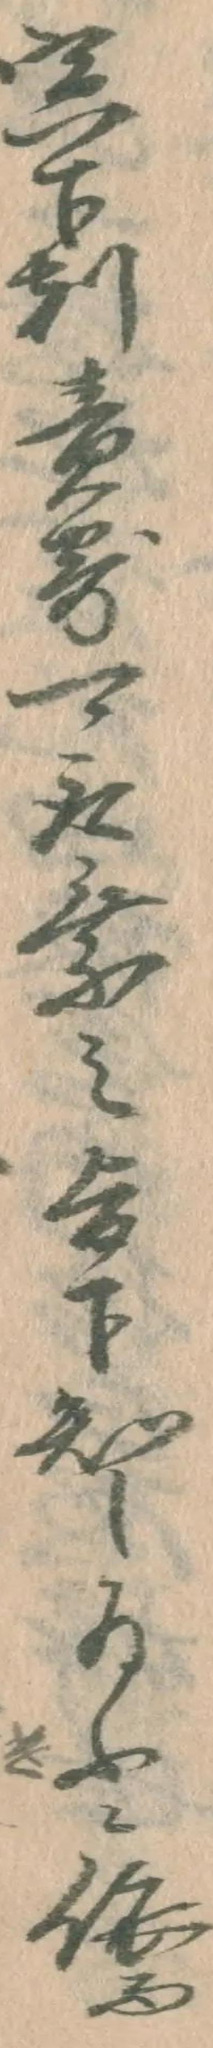寅下刻責寄可取乗之旨下知しゐふに依而
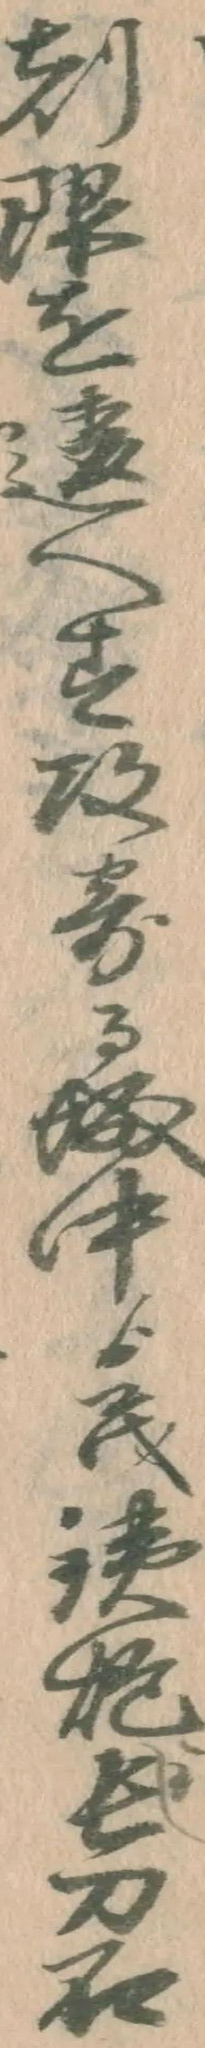刻限を違へ春攻寄る城中ゟ茂鉄炮鑓長刀石
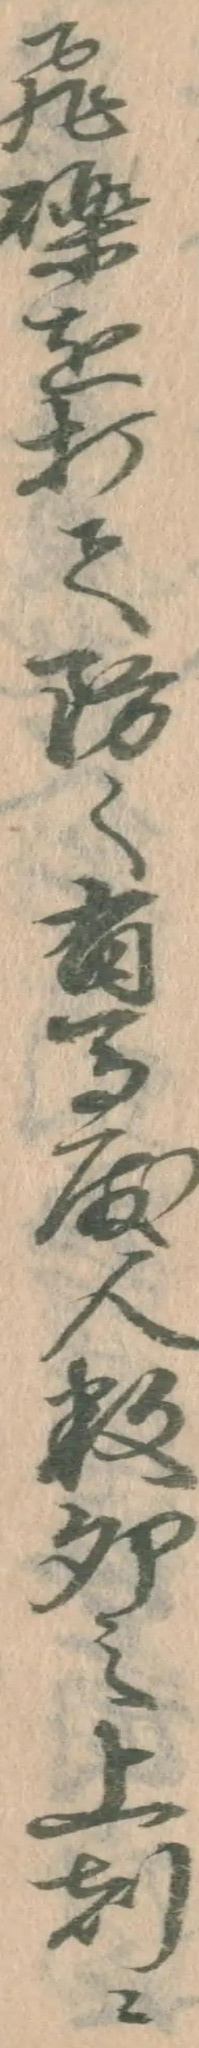飛礫を打て防く有馬殿人数夘之上刻に
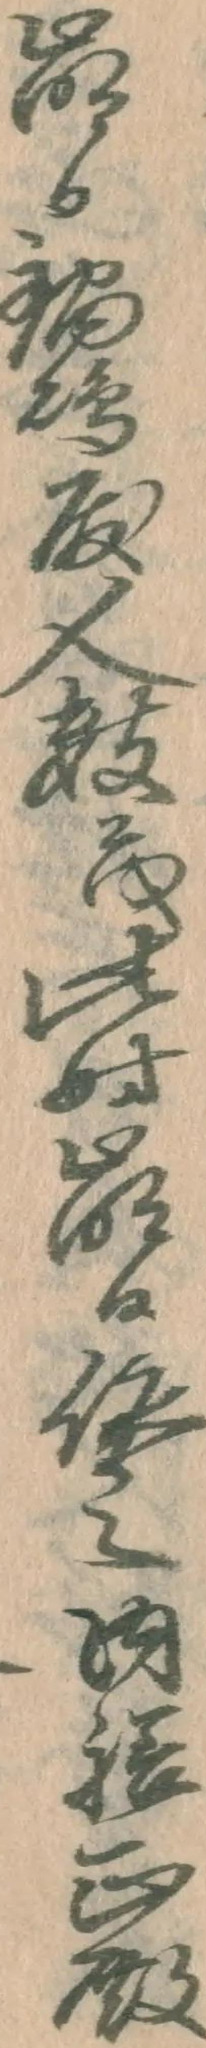崩る鍋島殿人数茂此時崩る依之内膳正殿
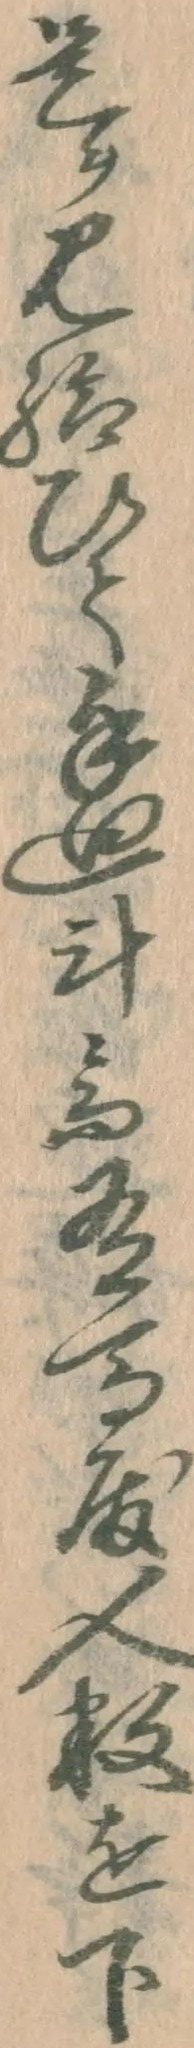是を見給ひて手廻斗に而有馬殿人数を下
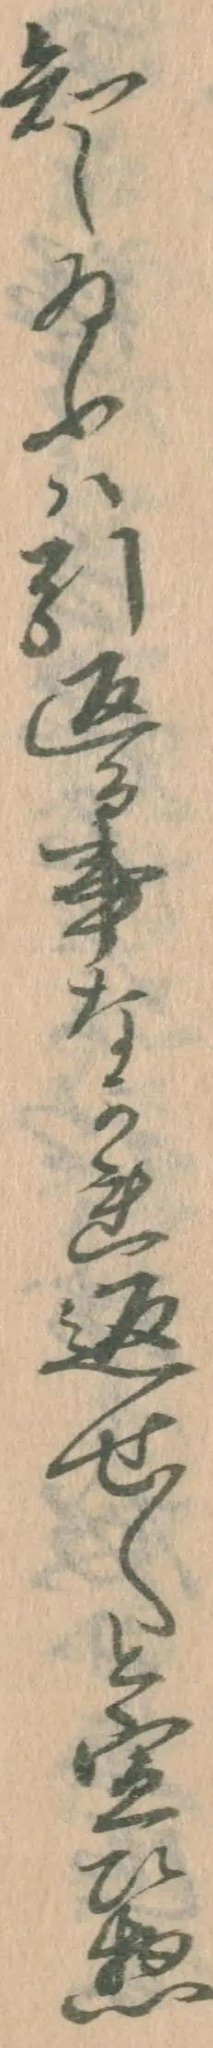知しゐふは引返る事なか連返せ〳〵と宣ひ惣
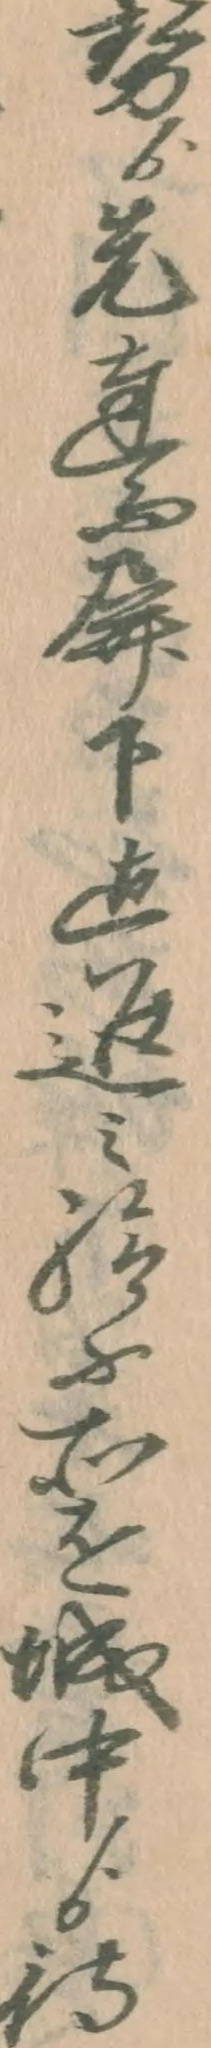勢ゟ先達而屏下迄進み給ふ所を城中ゟ待
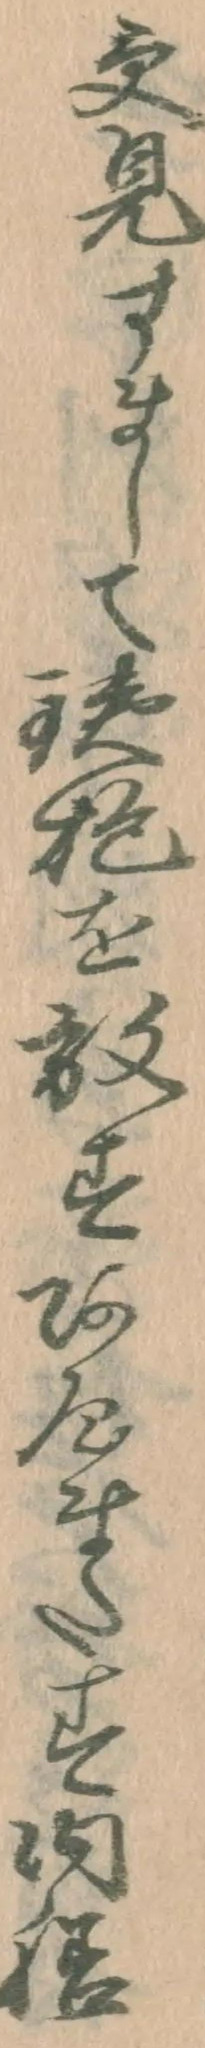受見すまして鉄炮を放春阿屋また春内膳
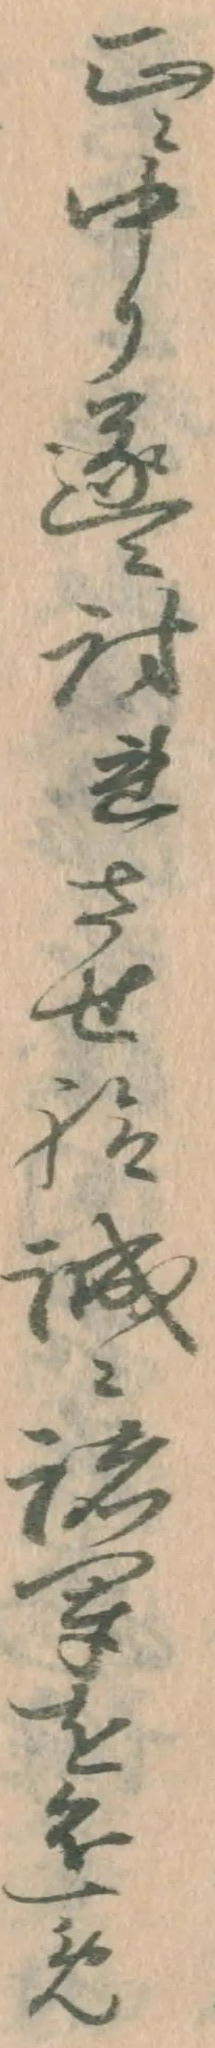正に中り遂に討連させ給誠に諸軍を進免
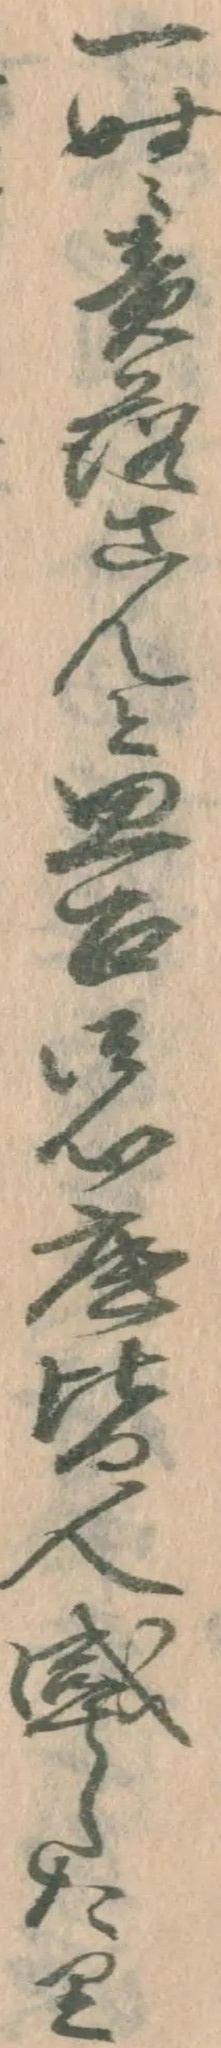一時に責落さんと思召御心底皆人感した里
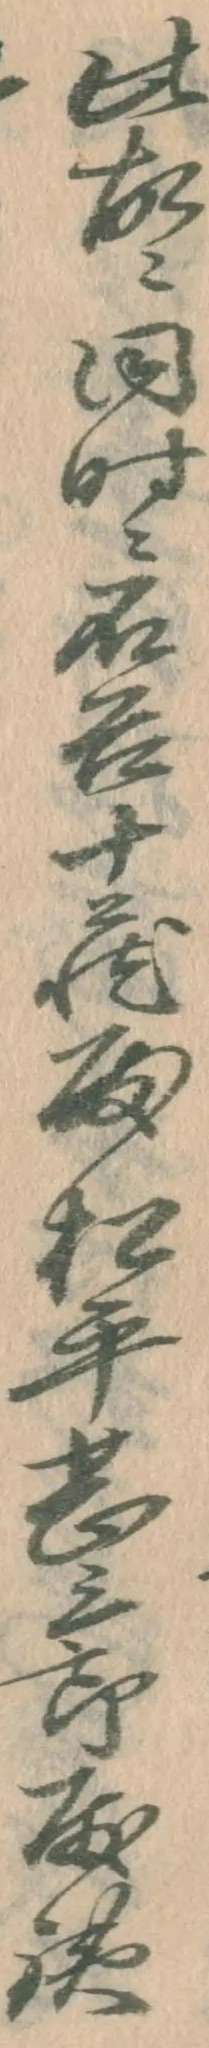此故に同時に石谷十蔵殿松平甚三郎殿鉄
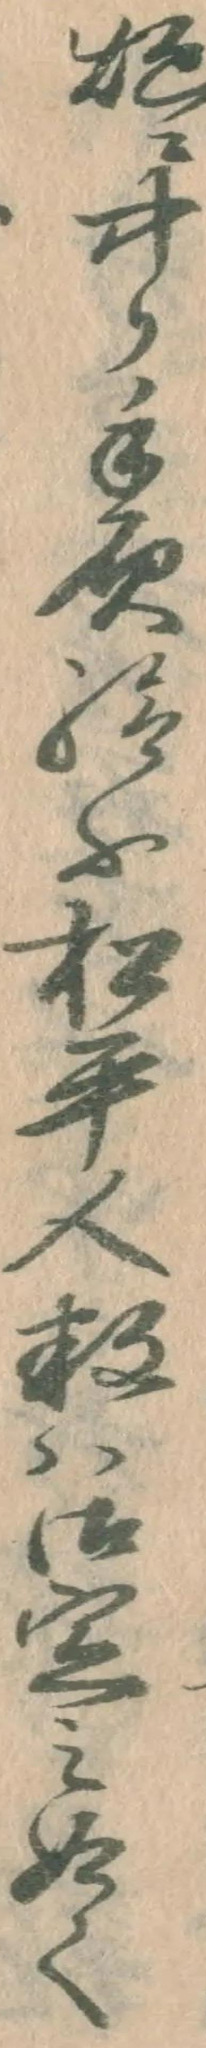炮に中り手負給ふ松平人数は御定之如く
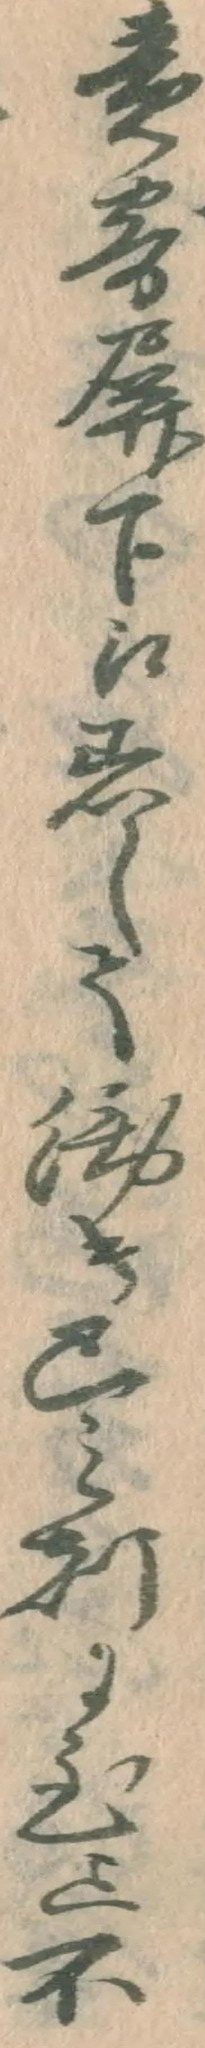責寄屏下江着して働き巳之刻尓至迄不
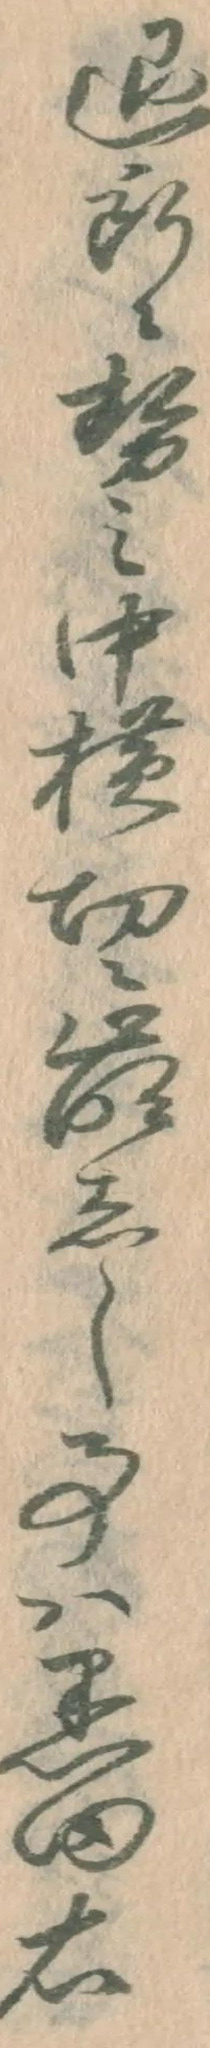退所に勢之中横切に崩者し事は黒田右
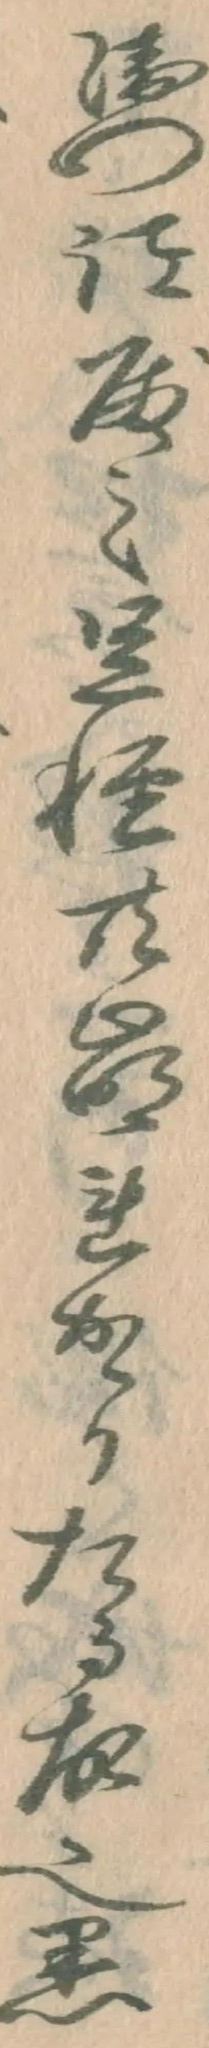衛門佐殿之足軽共崩連かゝりたる故也黒
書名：切支丹御退治記 49巻. [5]
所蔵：国立国会図書館 National Diet Library, JAPAN
